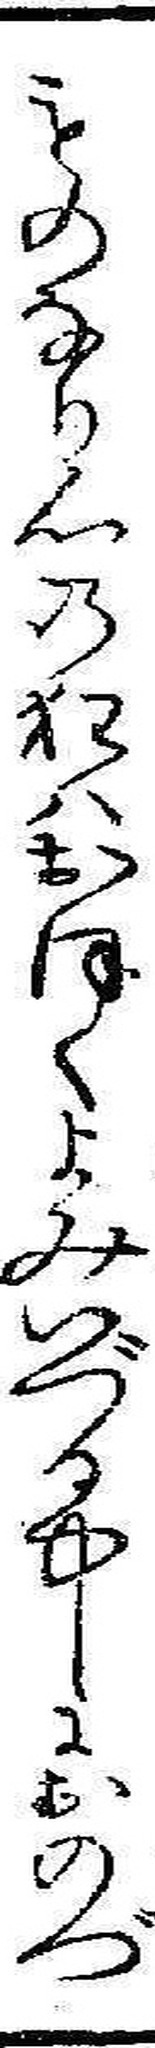ものなり心の狂はおほくよみいづる中におのづ
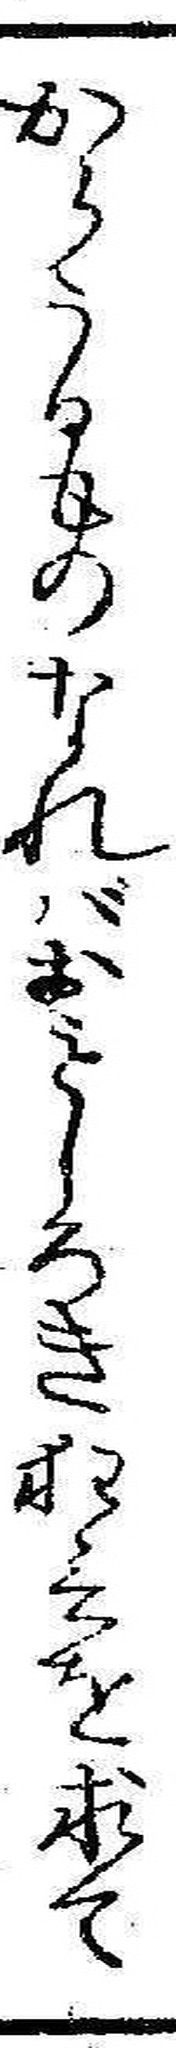からうるものなればおもしろき狂言を求て

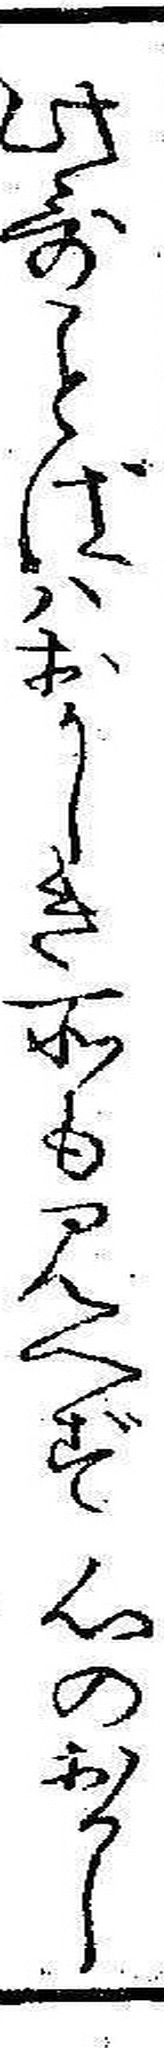此哥のことばはおかしき所の見へず心のおかし
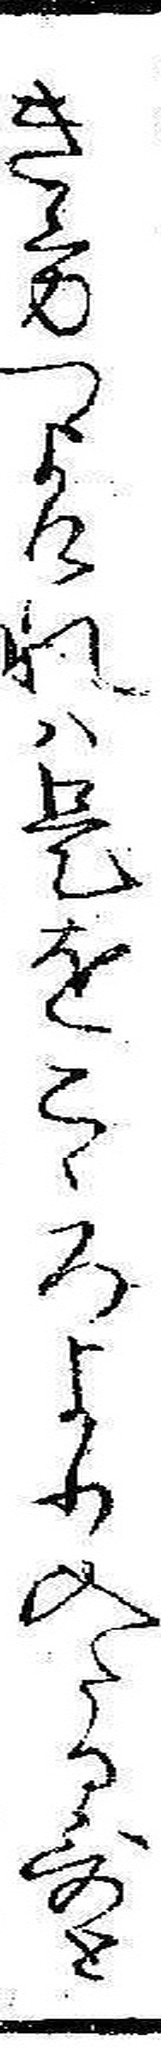き方つよけれは是をこゝろより入たるひのと
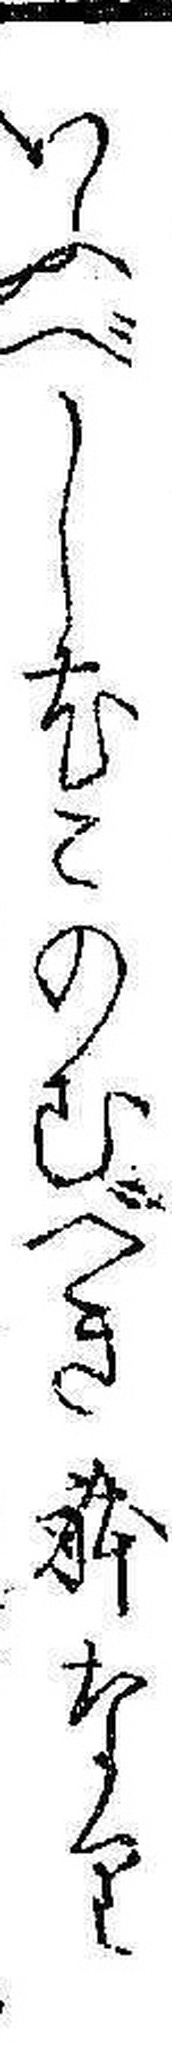いふべし尤このむべき躰なり
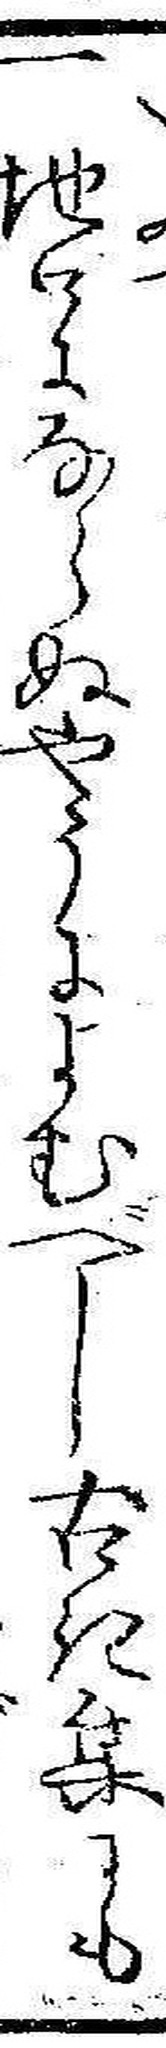一地口にならぬやうによむべし古き集にも
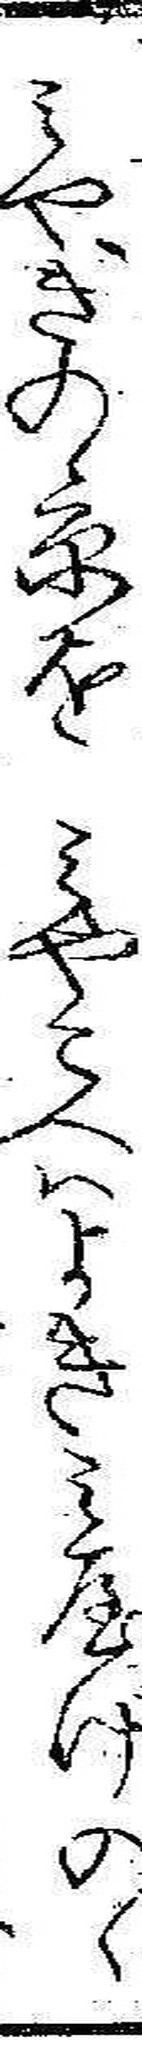みやぎの京をみやこ人はよきみやけのゝ
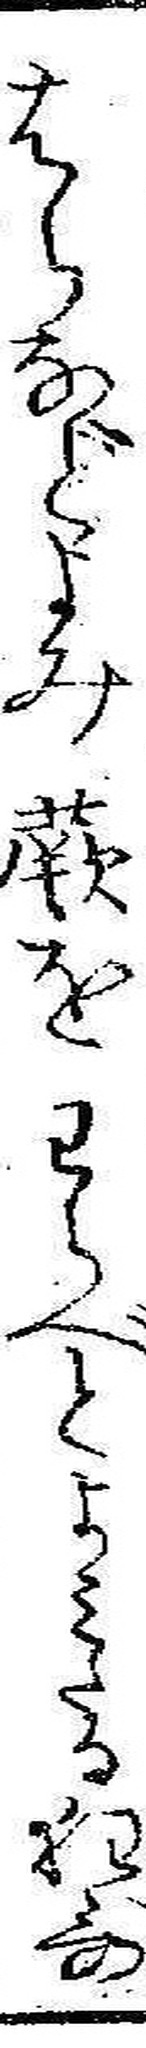はらなどよみ蕨をわらべとよみたる狂哥
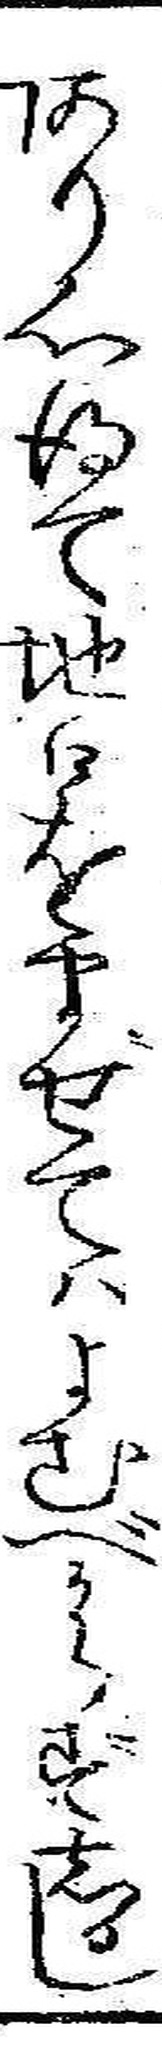あり心得て地をまぜてはよむべからずしるし
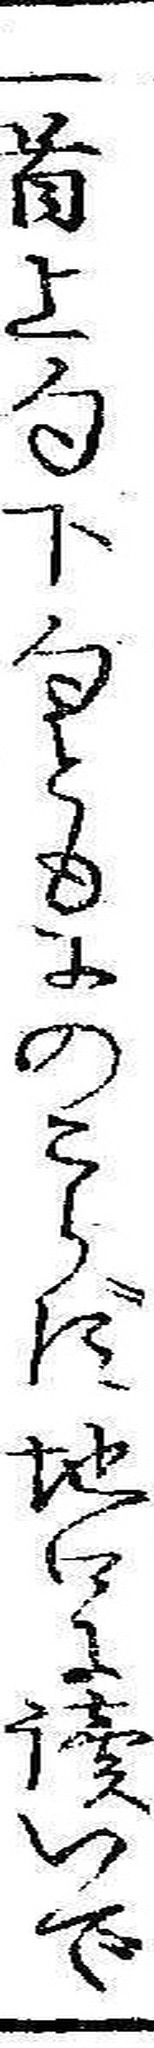一首上句下句ともにのこらず地口に讀いで
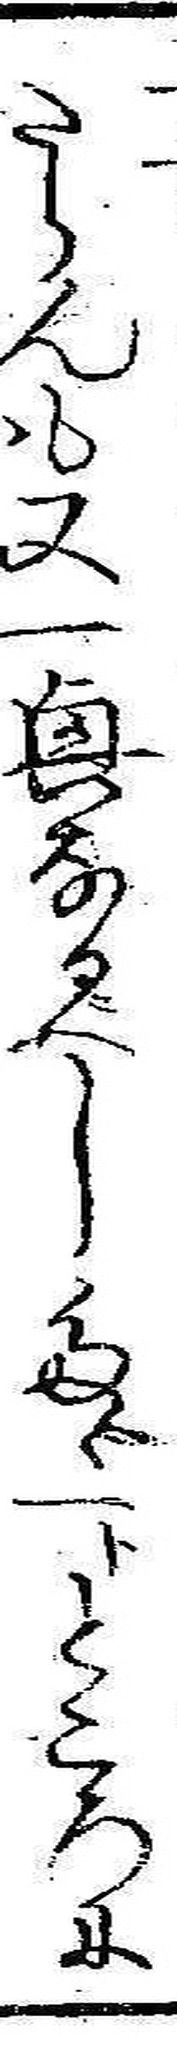たらんも又一興なるべしたゞ一とところに
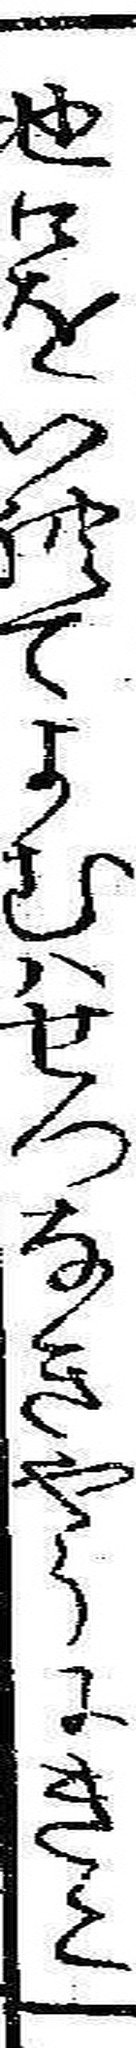地口をいれてよむはせつなきやうにきと
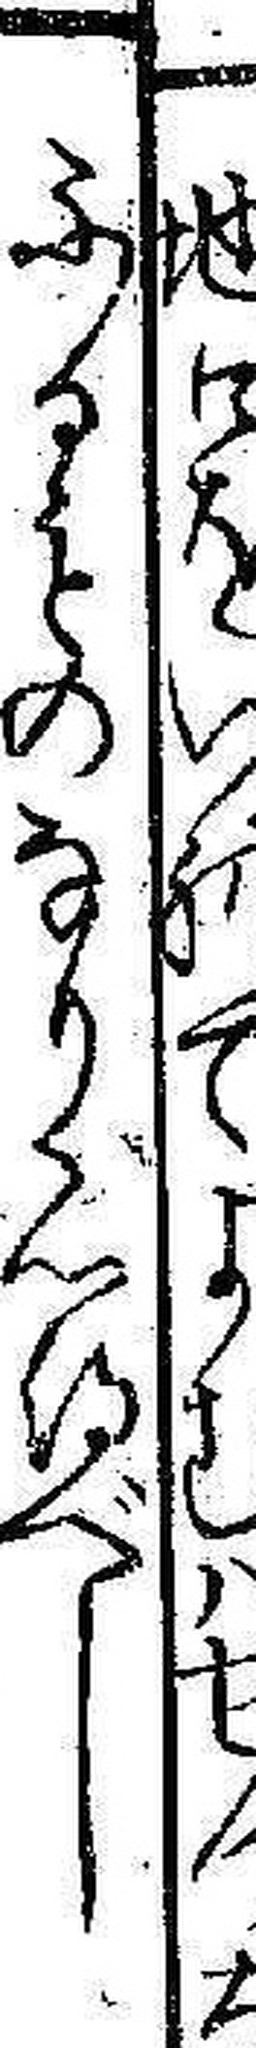ふるものなり心得べし
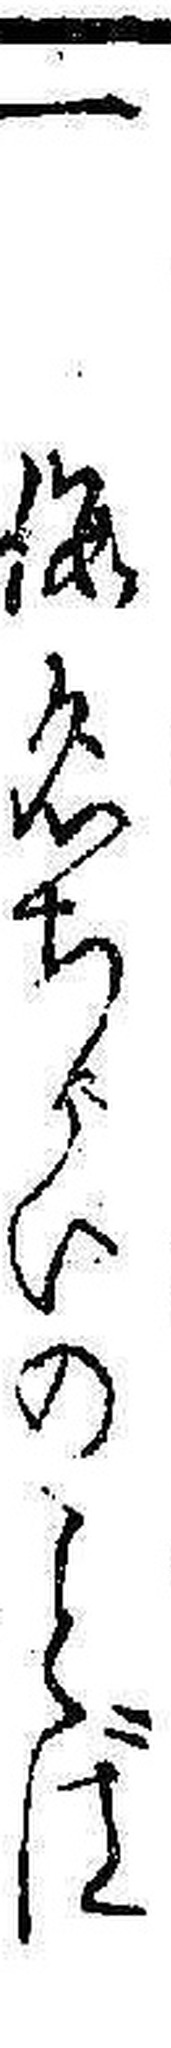一仮名ちがひのことば
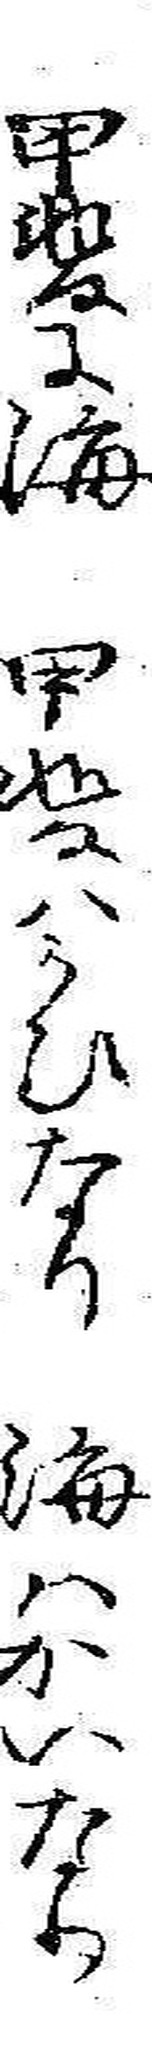甲斐に海甲斐はかひなり海はかいなり
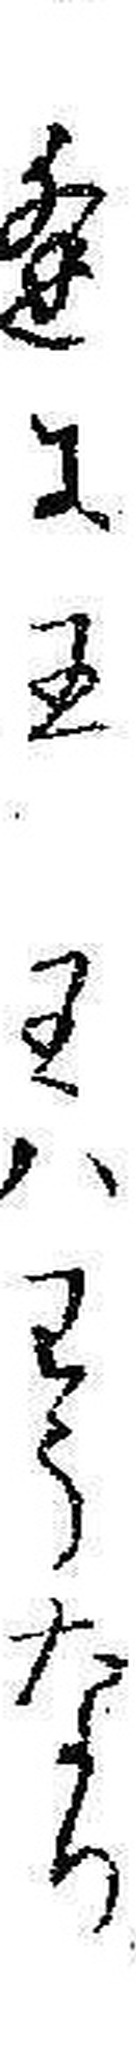逢に王王はわうなり
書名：狂哥はまのきさご
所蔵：国文学研究資料館
